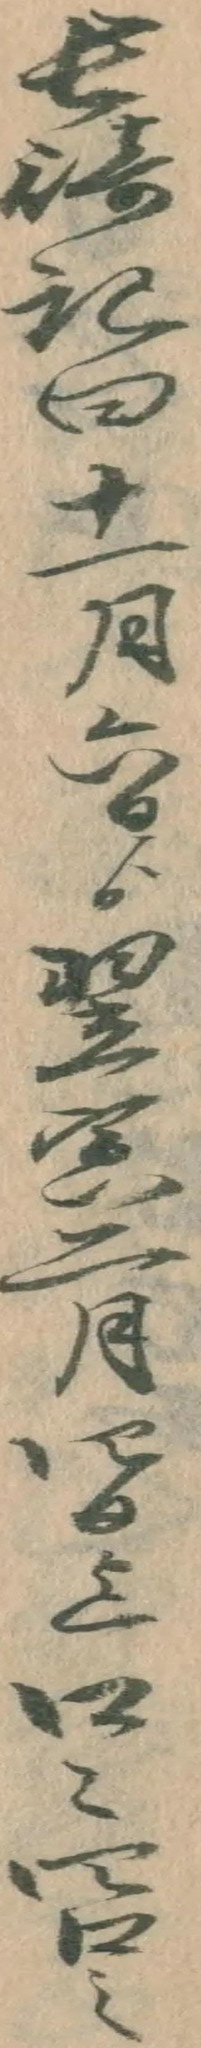長崎記曰十一月六日ゟ翌寅二月四日迄口々四口之
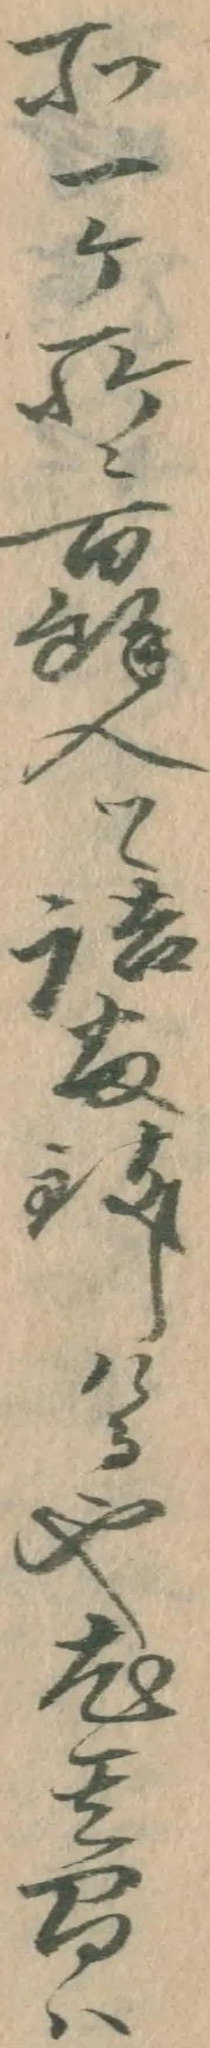所一け所に百余人つゝ詰番致しける也尤其間は
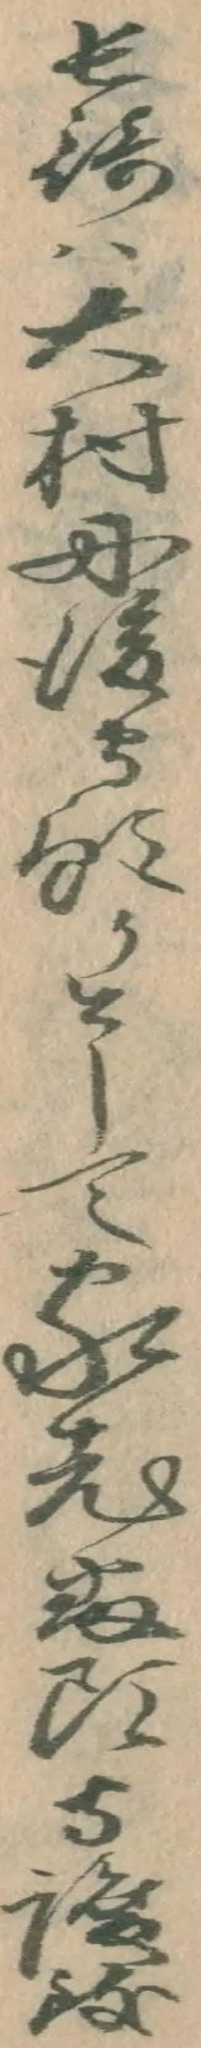長崎は大将丹後守預りとして家老番頭守護致
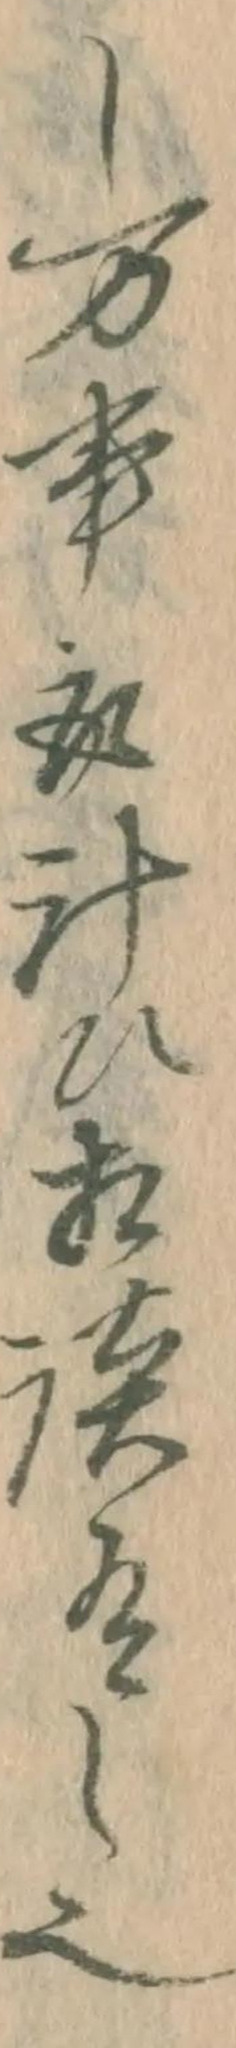し万事取計ひ相談有之也

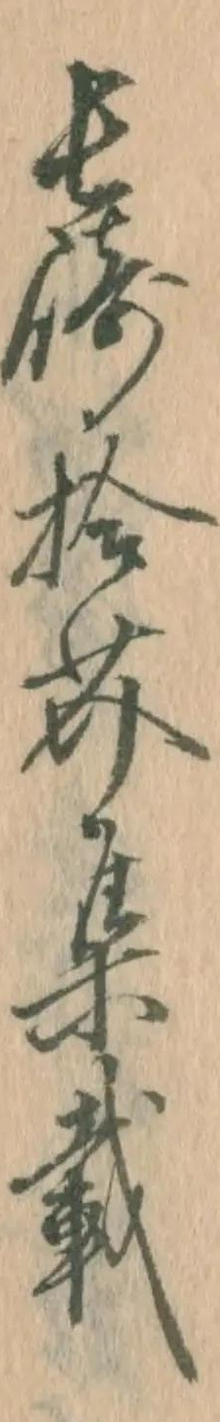長崎拾芥集載
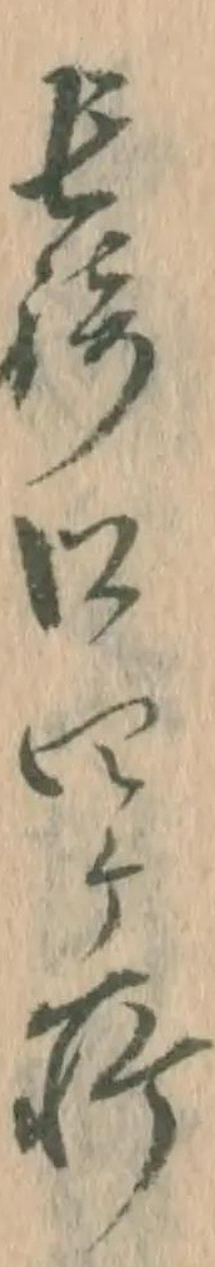長崎口四け所
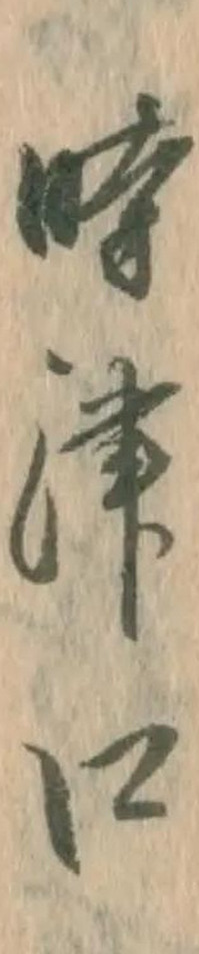時津口
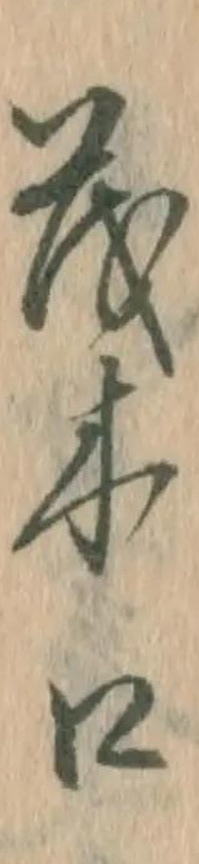茂木口
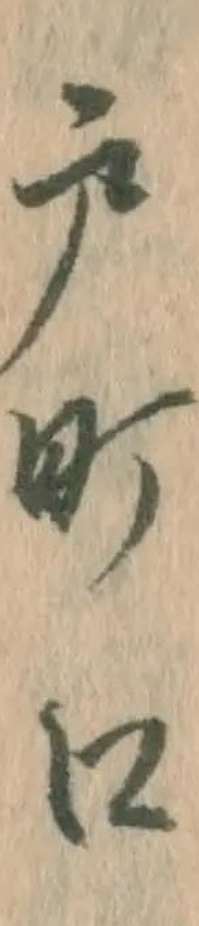戸町口
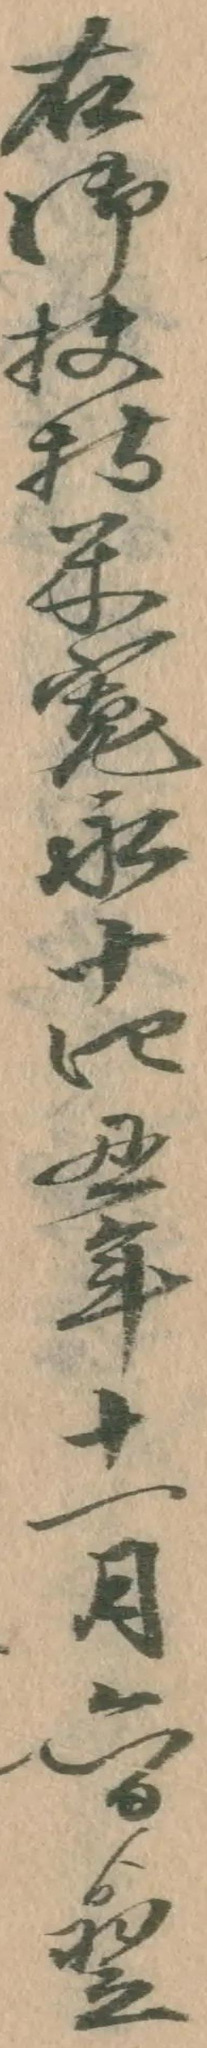右御扶持米寛永十四丑年十一月六日ゟ翌
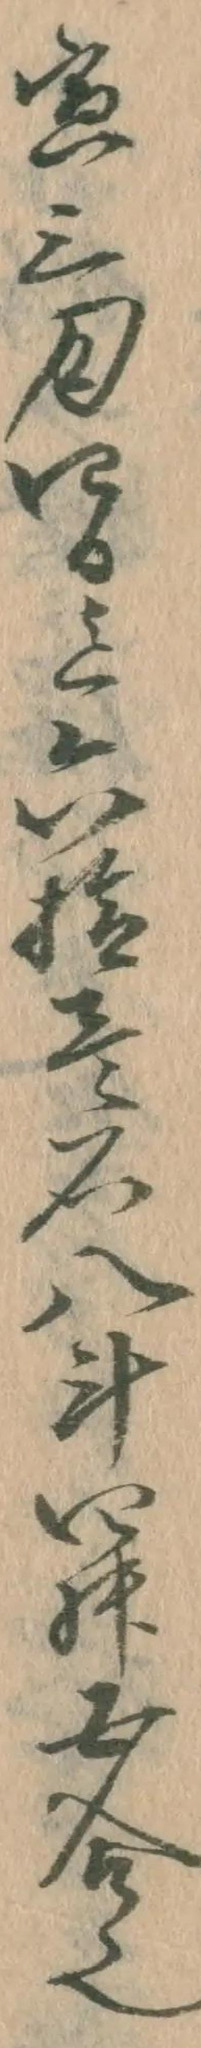寅三月四日迄六拾壱石八斗四升五合也
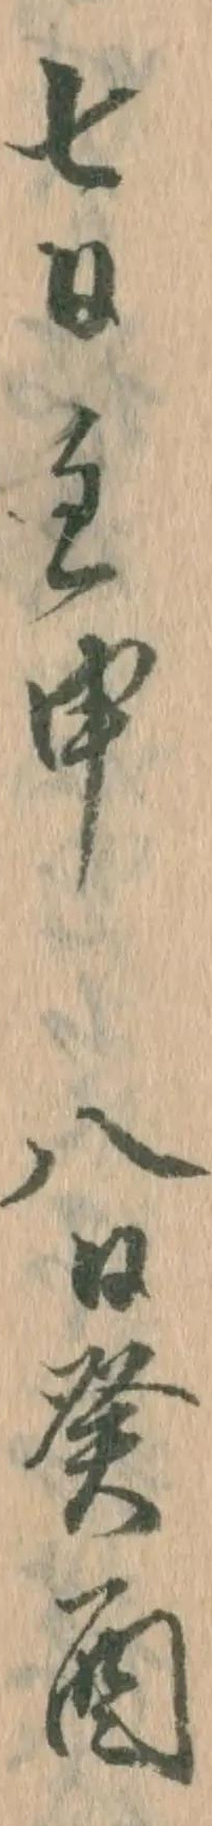七日壬申八日癸酉
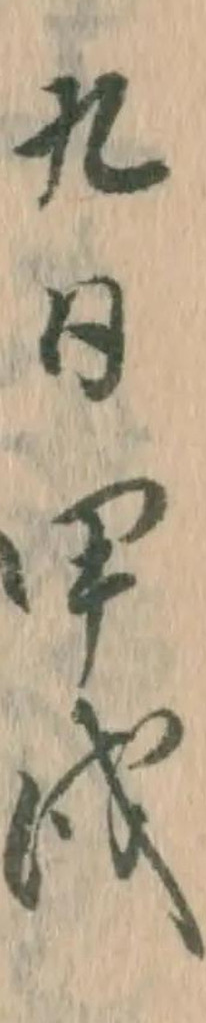九日甲戌
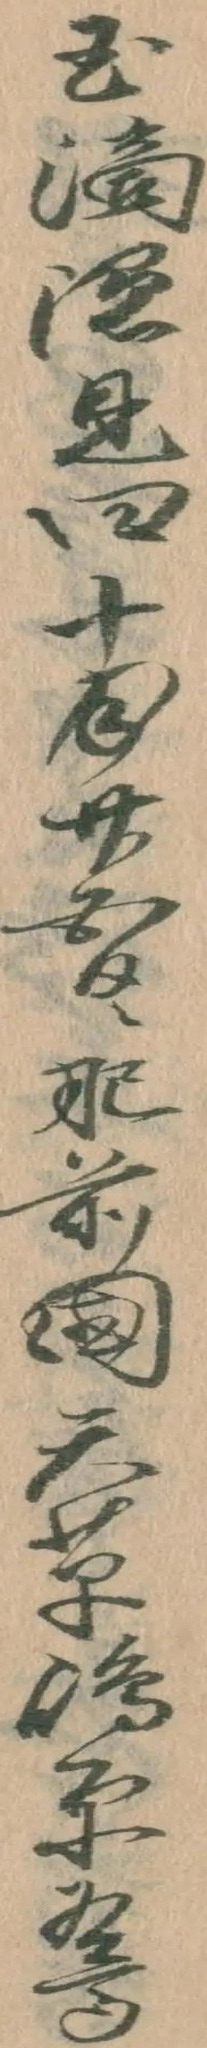玉滴隠見曰十月廿五日に肥前国天草島原有馬
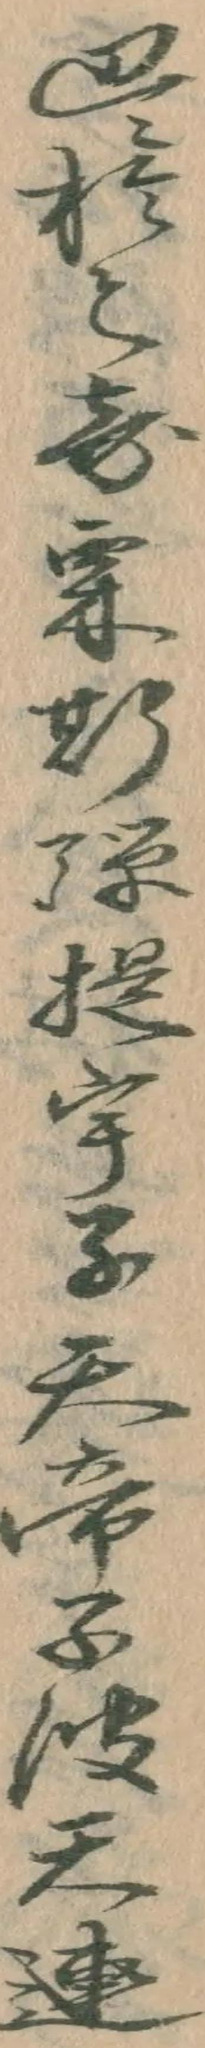辺に於て寄栗斯弾提宇子天帝子波天連
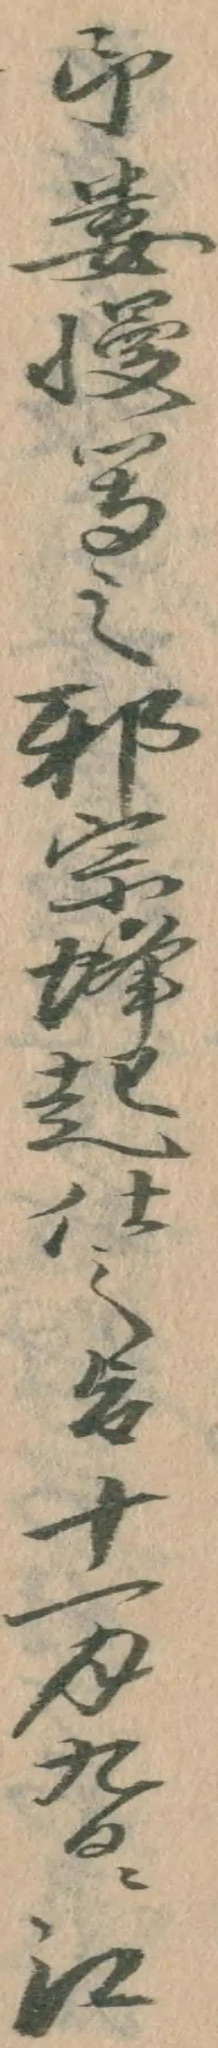即婁慢等之邪宗蜂起仕之旨十一月九日に江
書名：切支丹御退治記 49巻. [2]
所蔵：国立国会図書館 National Diet Library, JAPAN
